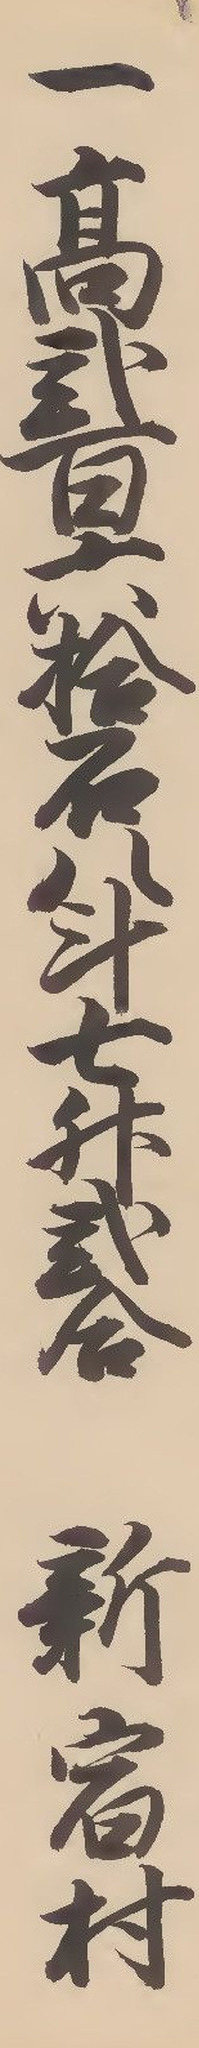一高弐百六拾石八斗七升弐合新宿村
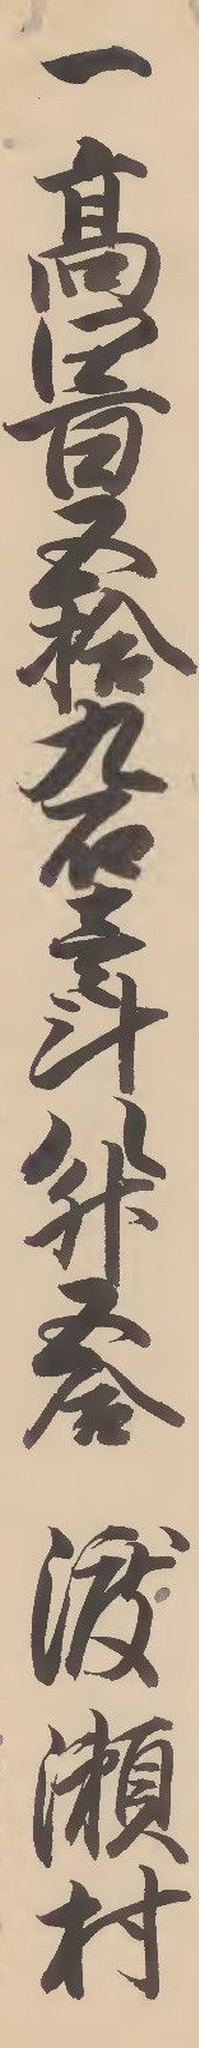一高四百五拾九石壱斗八升五合渡瀬村

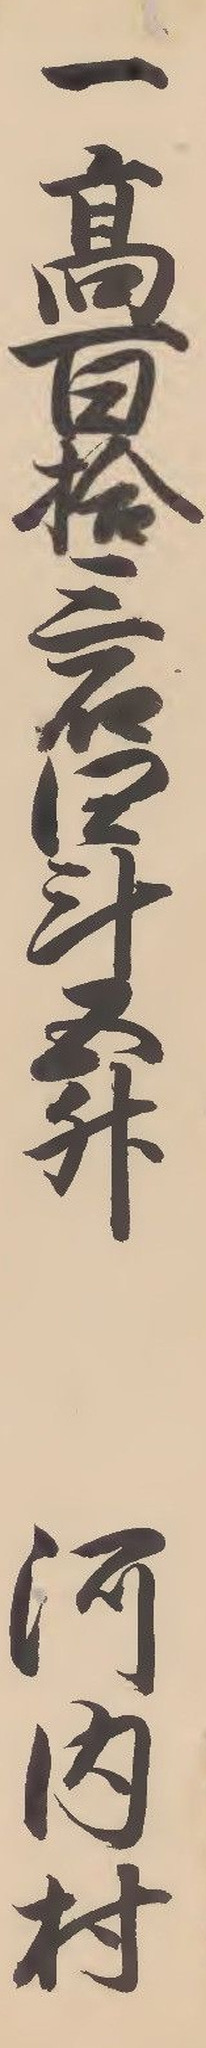一高百拾三石四斗五升河内村
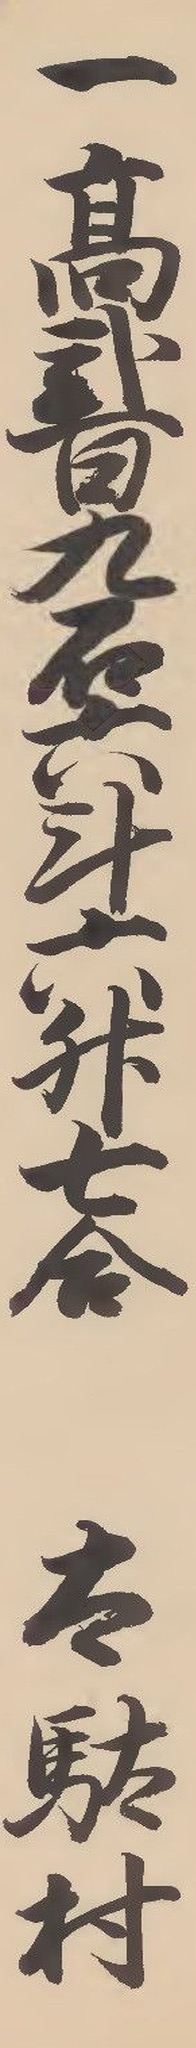一高弐百九石六斗六升七合太駄村
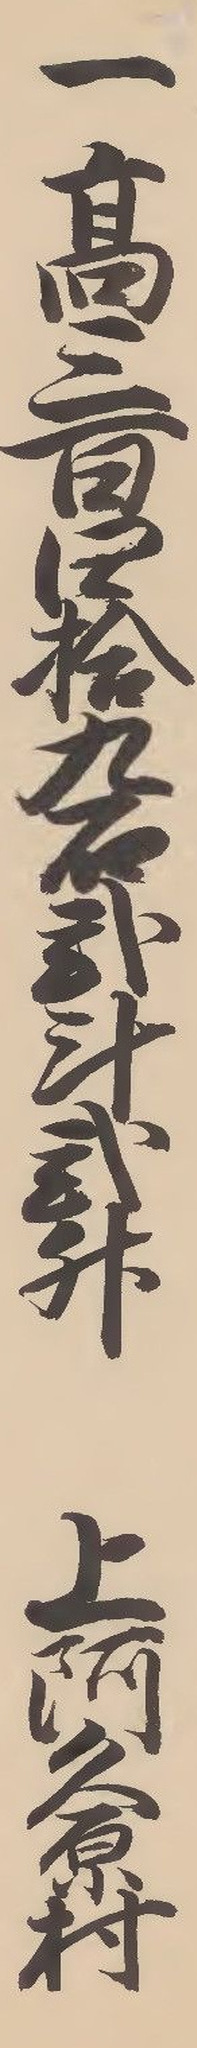一高三百四拾九石弐斗弐升上阿久原村
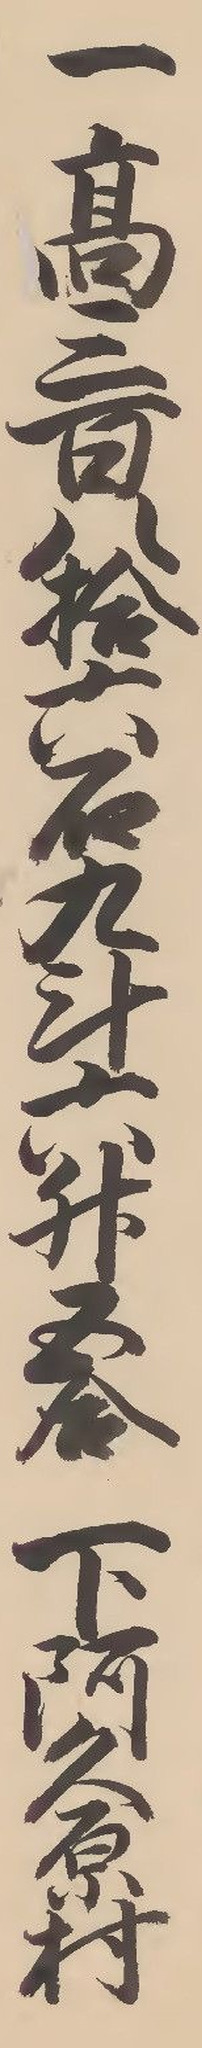一高三百八拾六石九斗六升五合下阿久原村
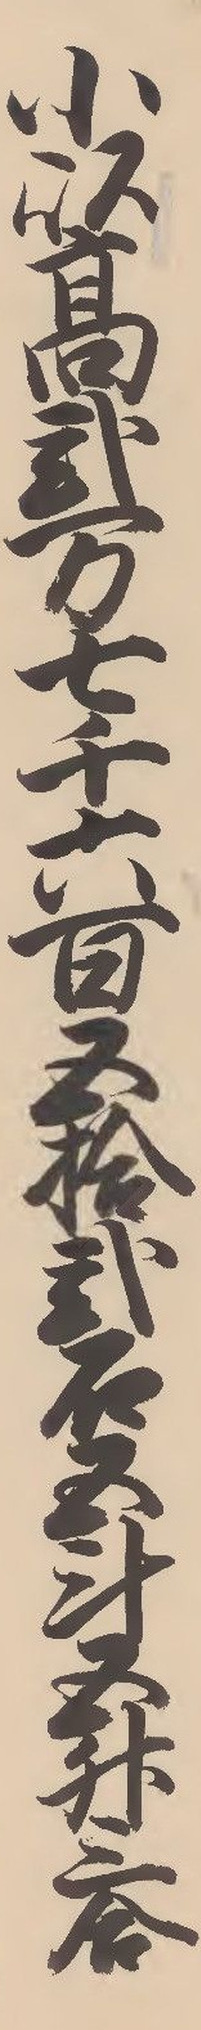小以高弐万七千六百五拾弐石五斗五升三合

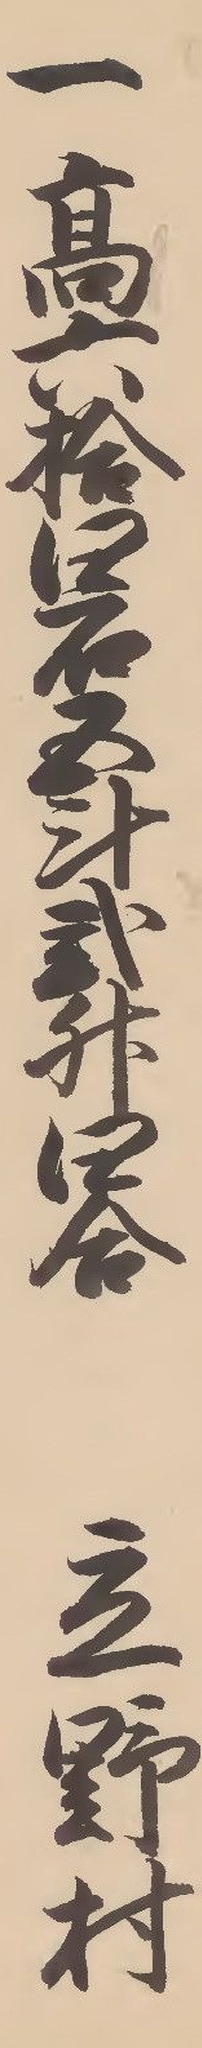一高六拾四石五斗弐升四合立野村
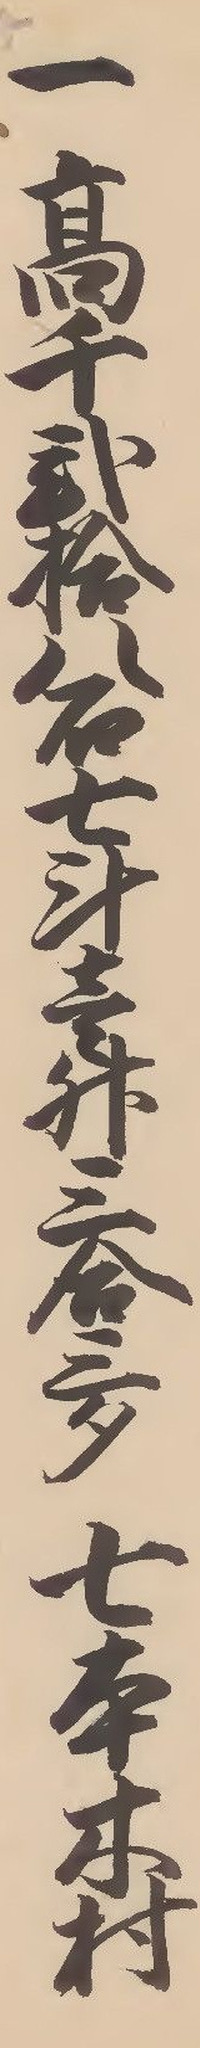一高千弐拾八石七斗壱升三合三勺七本木村
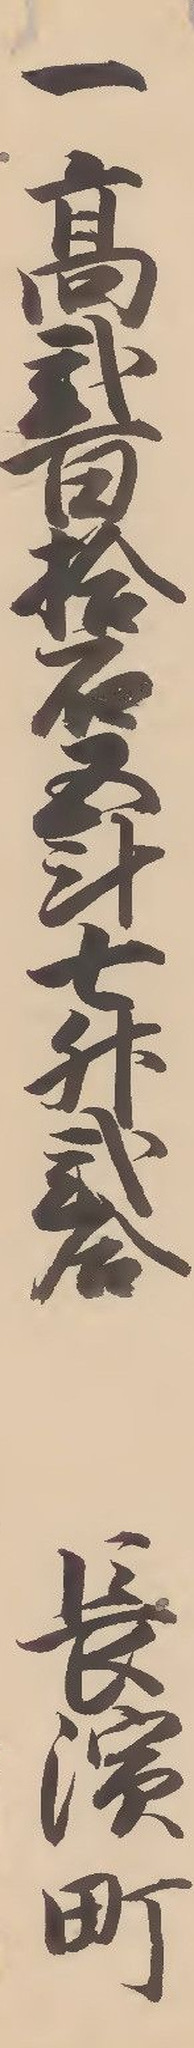一高弐拾石五斗七升弐合長濱町

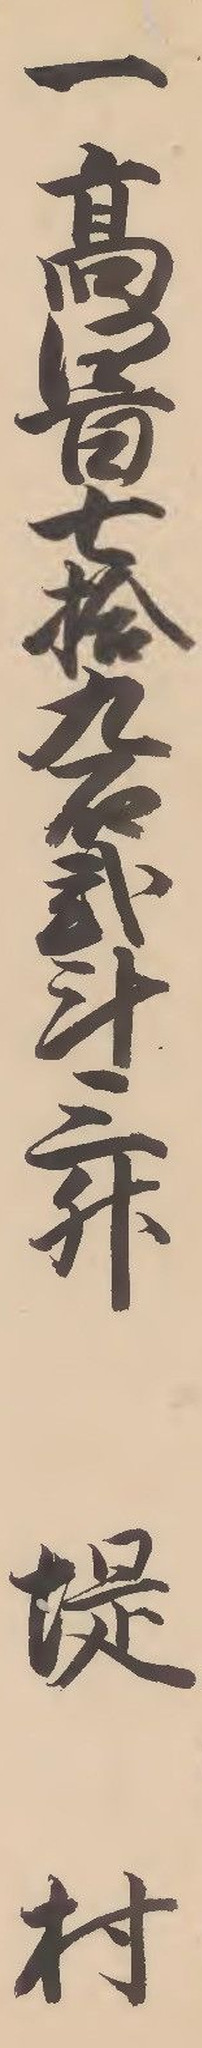一高四百七拾九石弐斗三升堤村
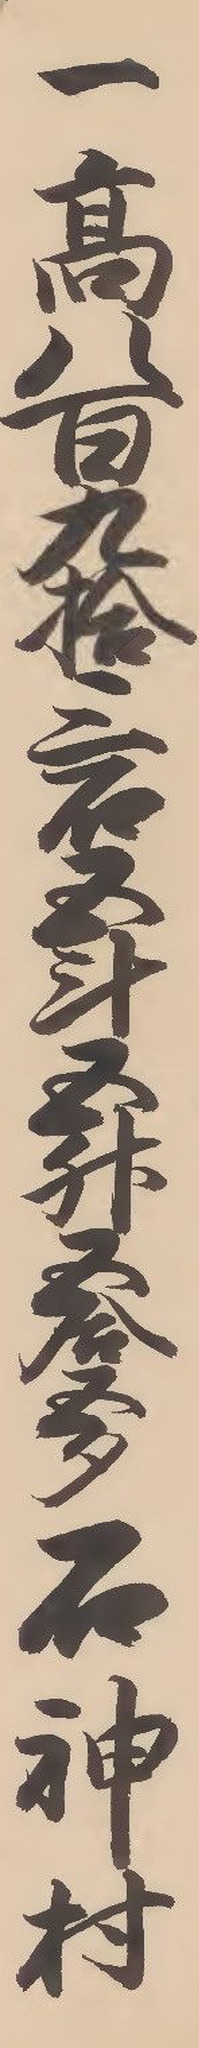一高八百九拾三石五斗五升五合五勺石神村
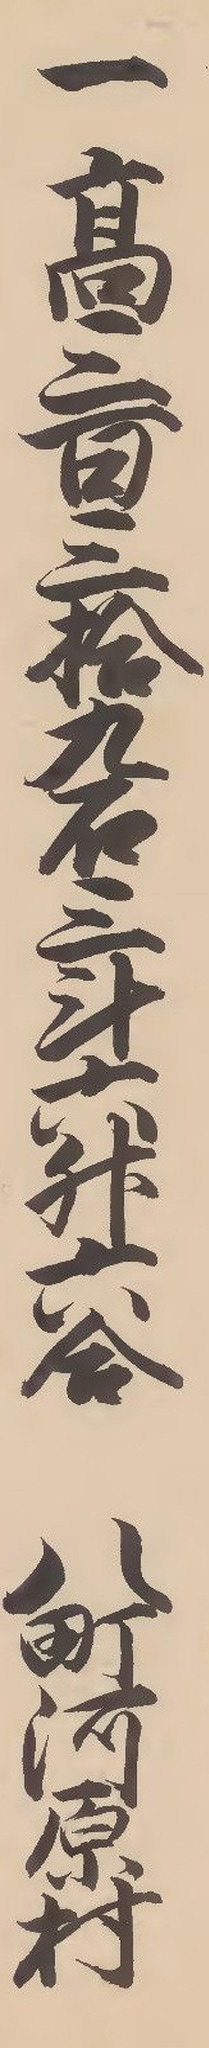一高三百三拾九石三斗六升六合八町河原村
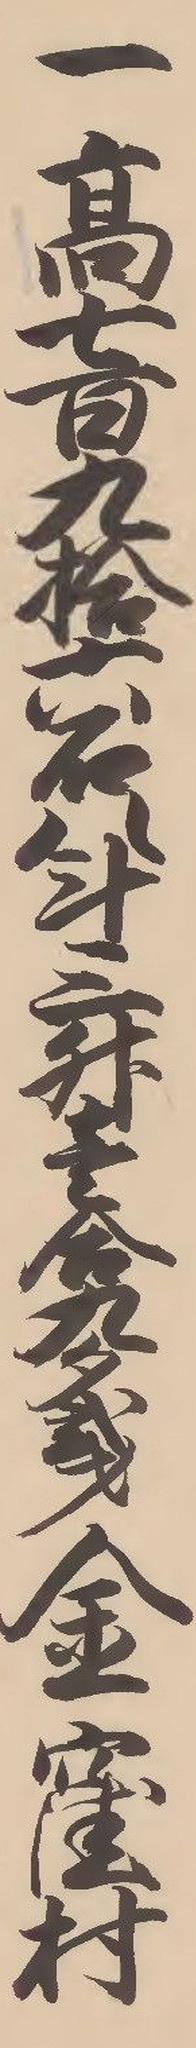一高七百九拾六石八斗三升壱合九勺弐才金窪村
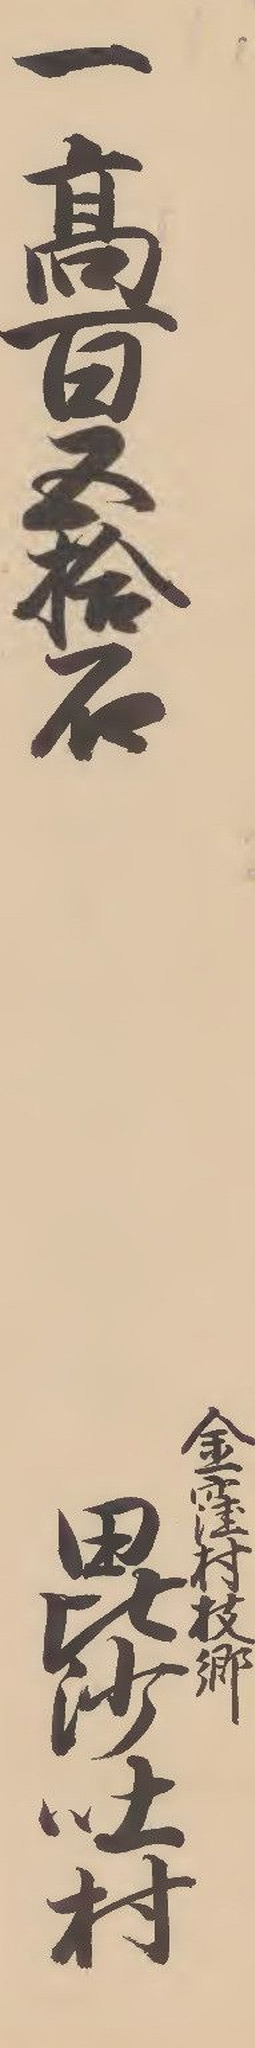一高百五拾石毘砂吐村
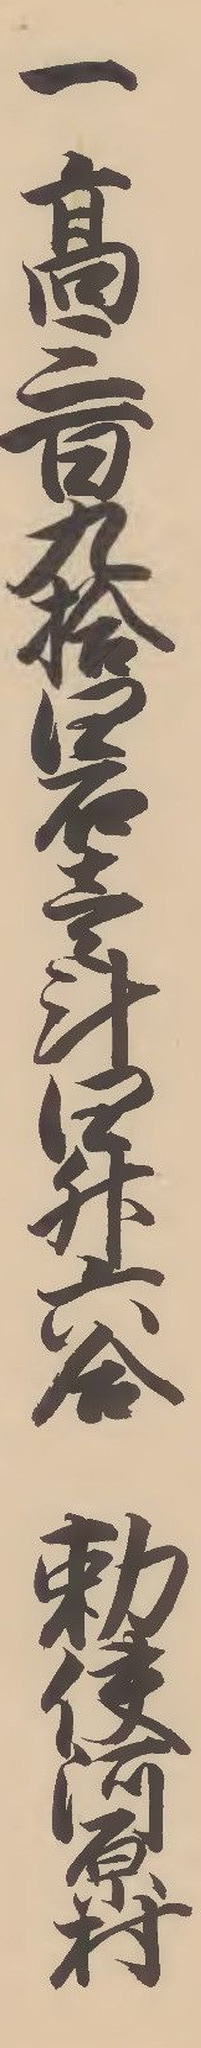一高三百九拾四石壱斗四升六合勅使河原村
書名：武蔵国郷帳　下
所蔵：国立公文書館 National Archives of Japan
